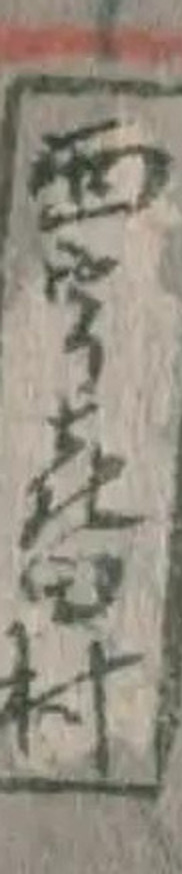西宇喜田村
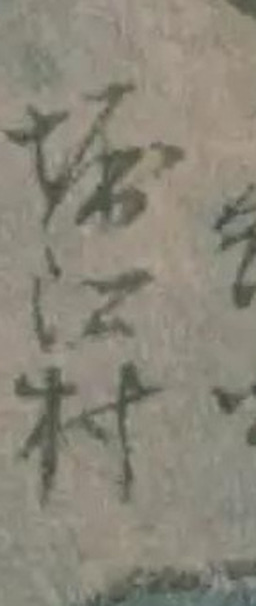堀江村
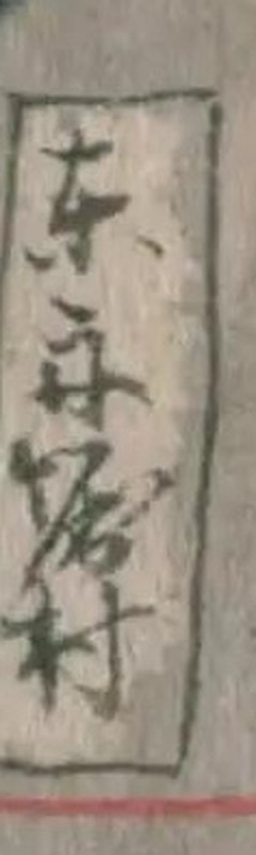東船堀村
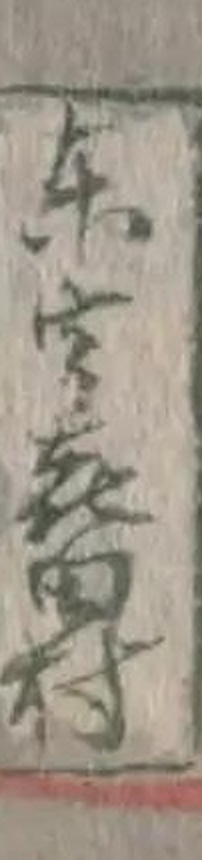東宇喜田村
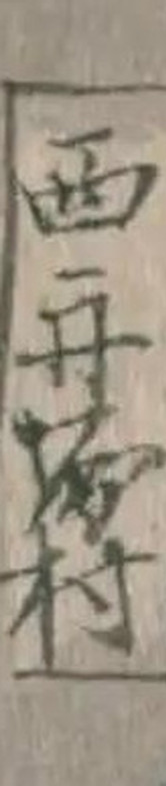西船堀村
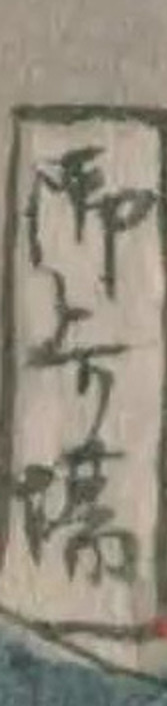御上り場
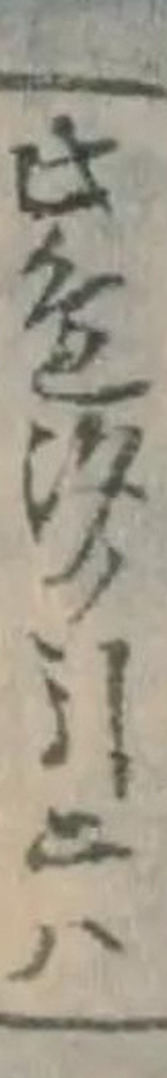此辺汐ノ引ニハ
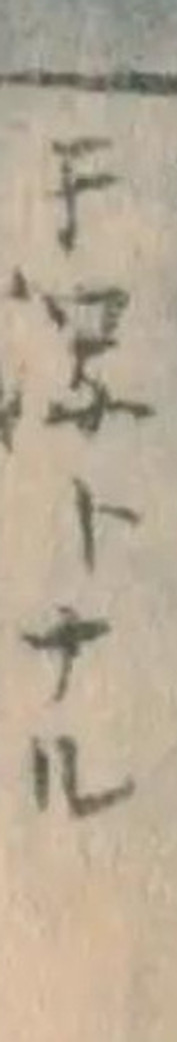干潟トナル
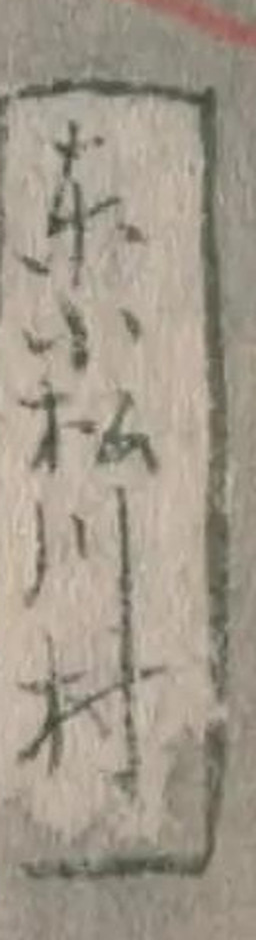東小松川村
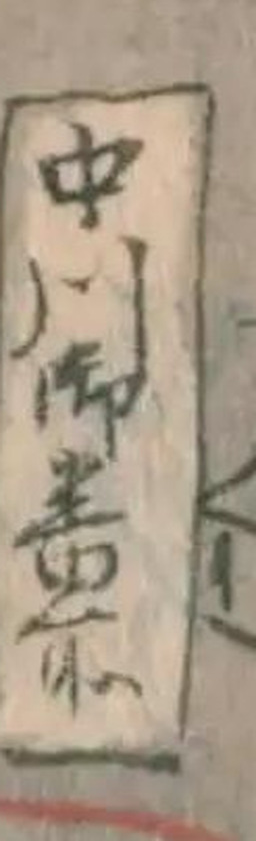中川御番所
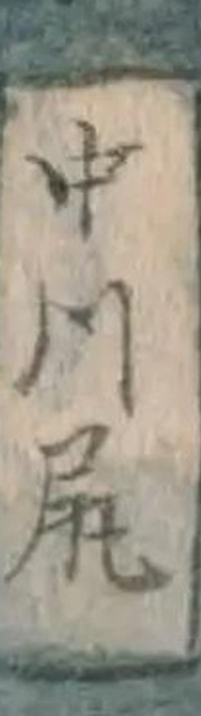中川尻
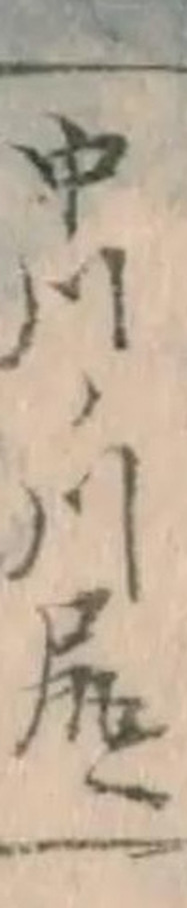中川ノ川尻ヘ
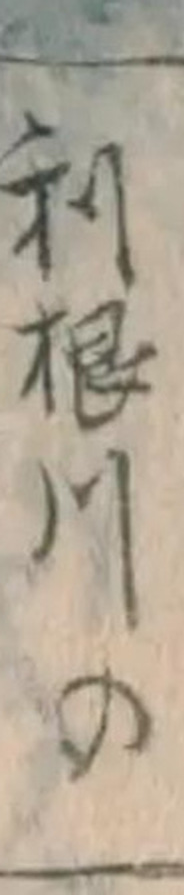利根川の
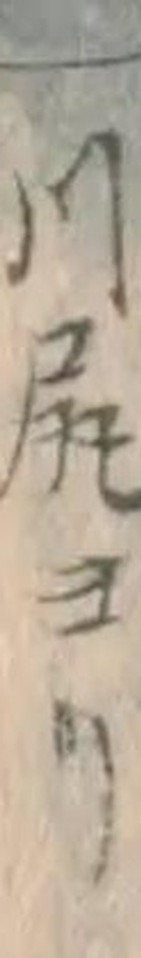川尻ヨリ
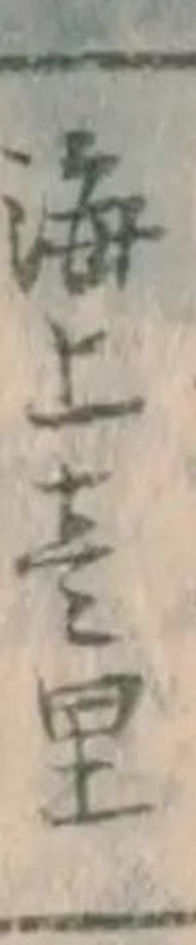海上壱里
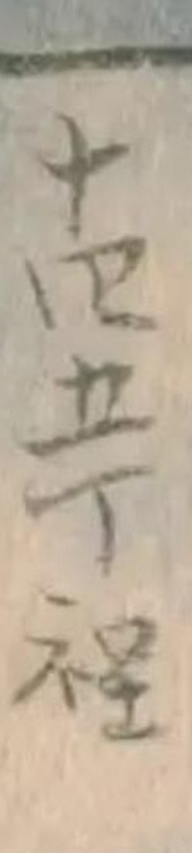十四五丁程
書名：四神地名録 6巻. [4]葛飾郡
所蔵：国立国会図書館 National Diet Library, JAPAN
